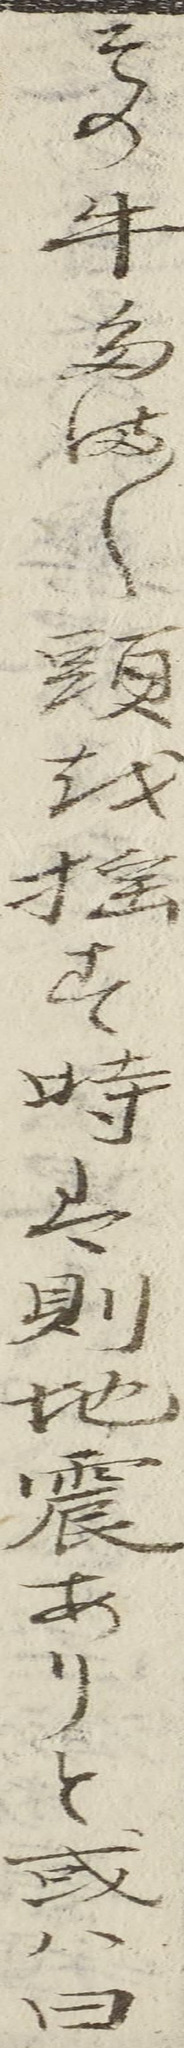その牛たま〳〵頭を揺す時は則地震ｓりて或ハ曰
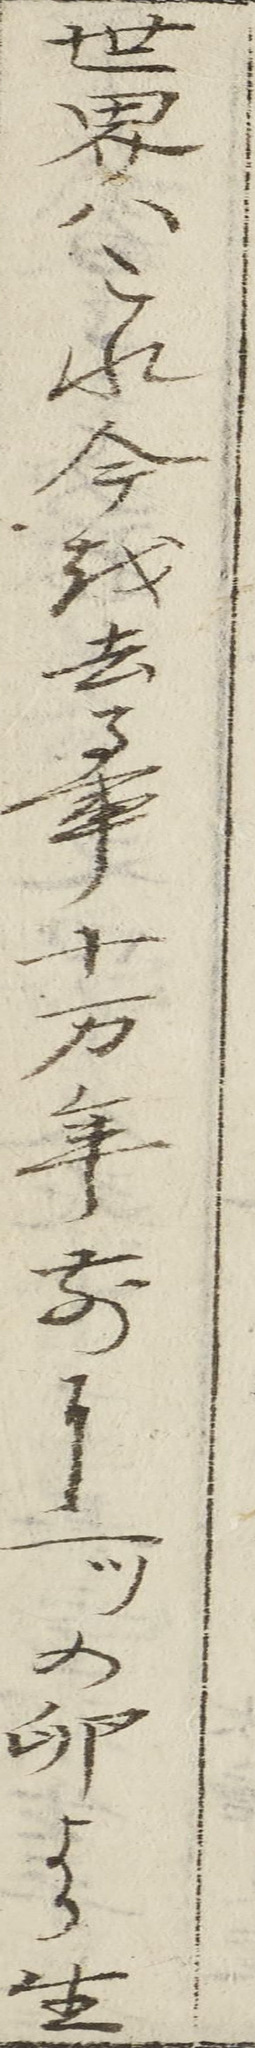世界ハこれ今を去る事十万年前に一ッの卵より生

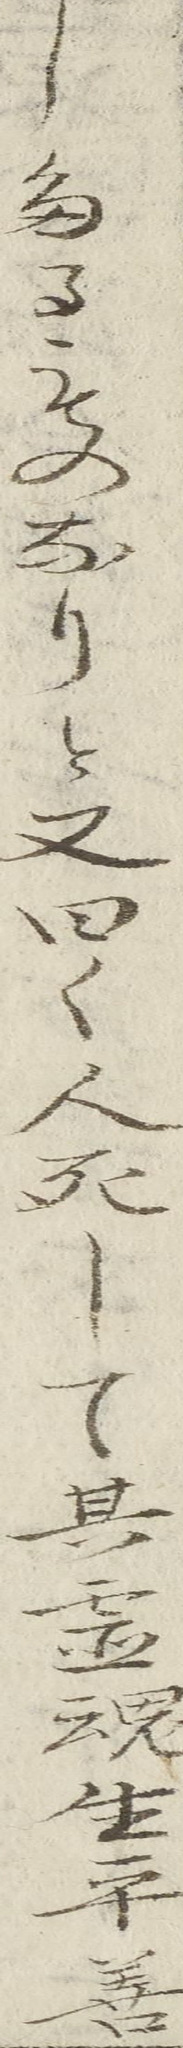したるものなりと又曰人死して其霊魂生平善
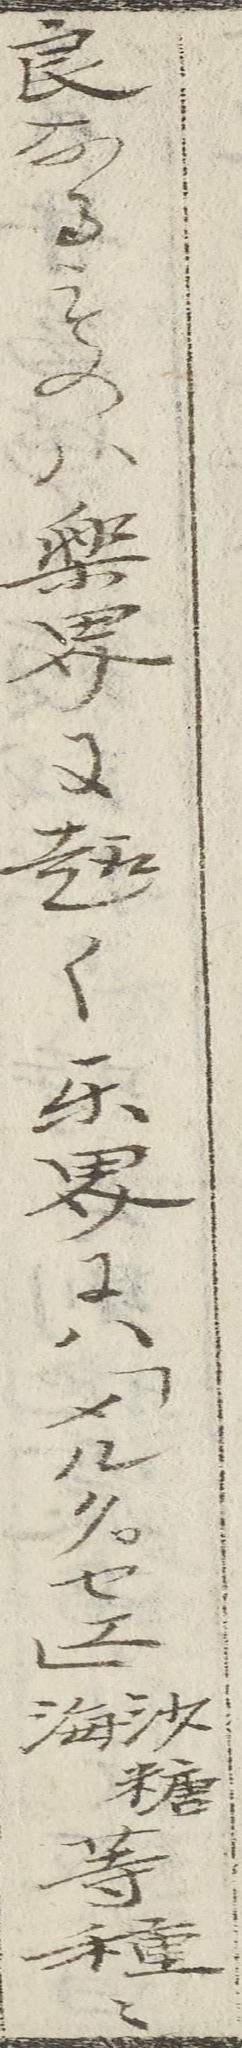良なるものハ楽界に趣く楽界とハ「メルク。セエ」汝糖海等種々
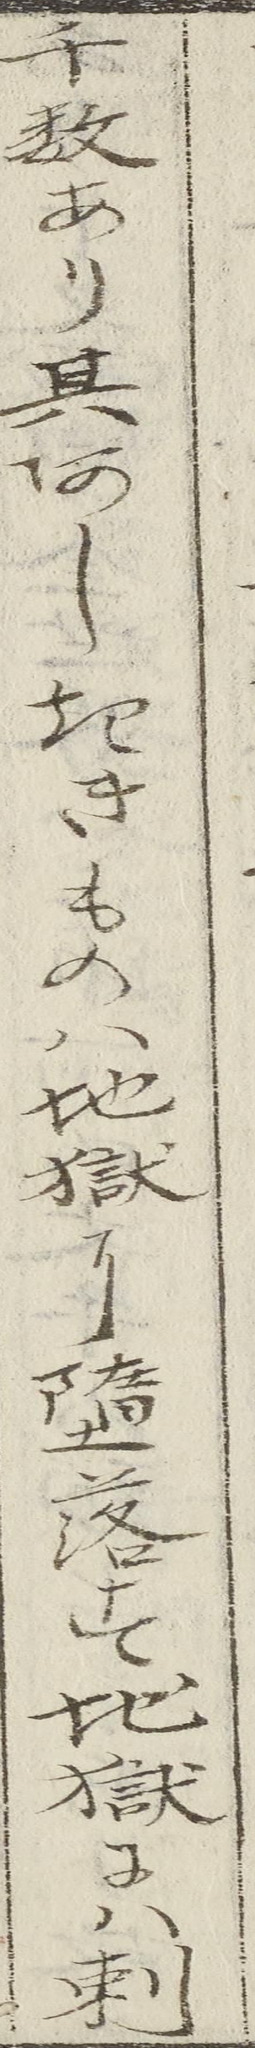千数あり其あしおきものハ地獄に堕落す地獄にハ刺
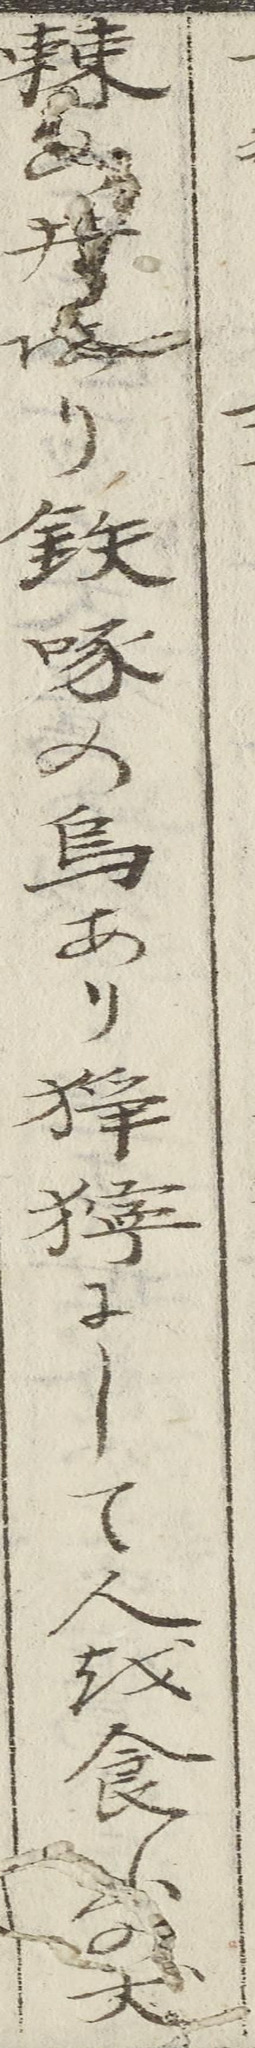棘の井あり鉄啄の鳥あり猙獰にして人を食ふの犬
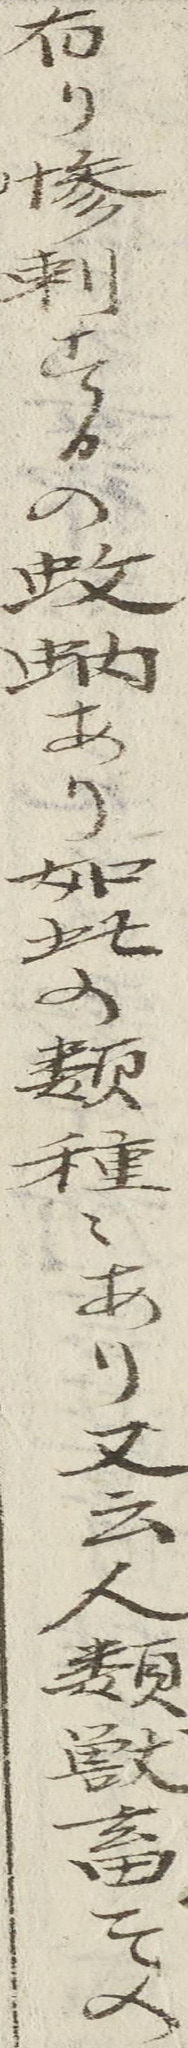有刺するの蚊蚋あり如此の類種々あり又云人類獣畜その
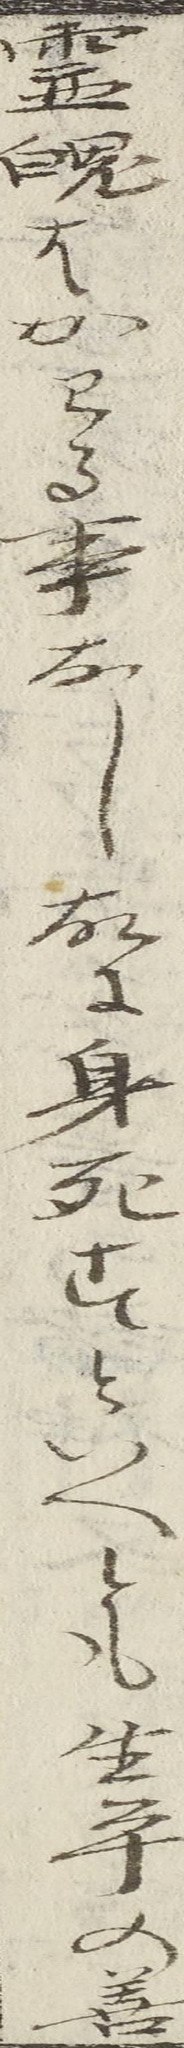霊魂はかわる事なし故に身死すといへとも生平の全
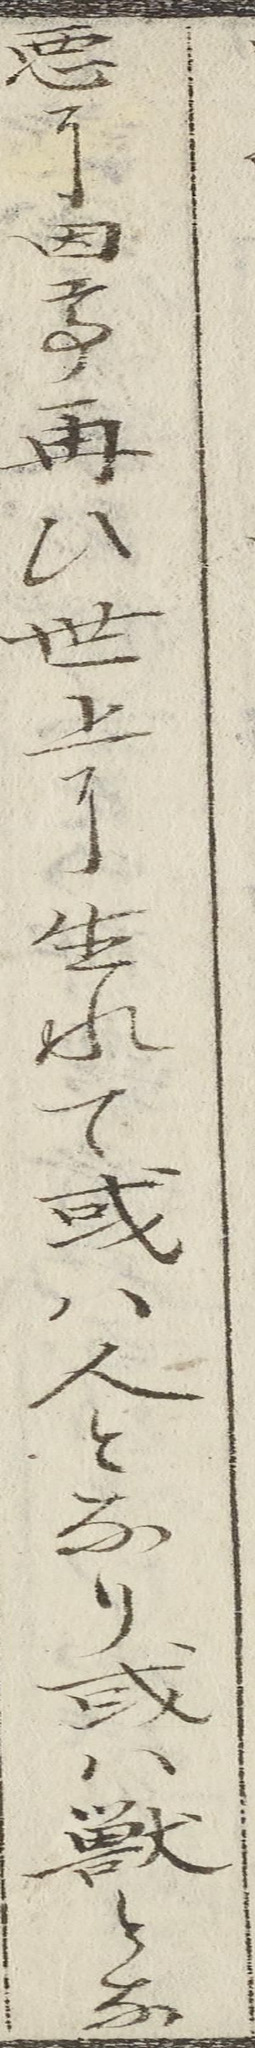悪に因て再ひ世上に生れて或ハ人となり或ハ獣とな
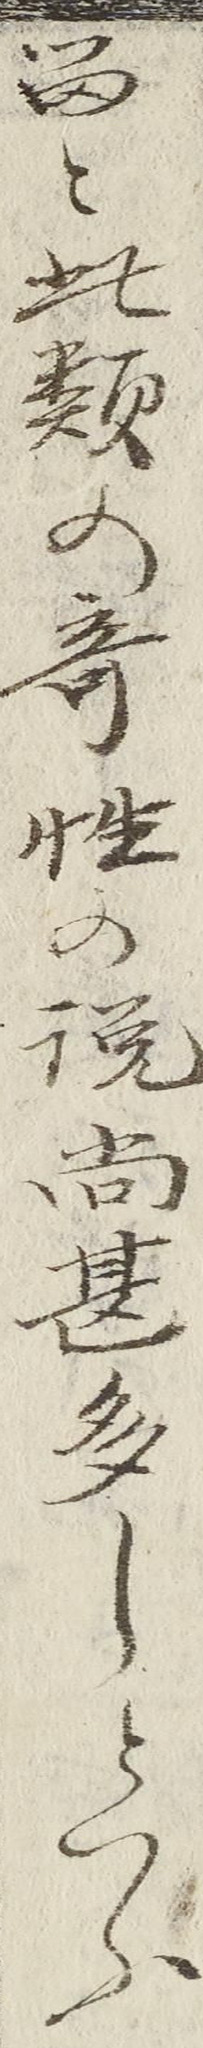ると此類の奇性の説尚甚多しといふ
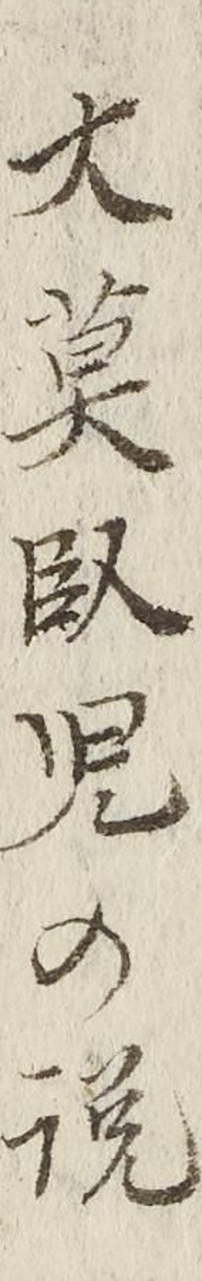大莫臥児の説
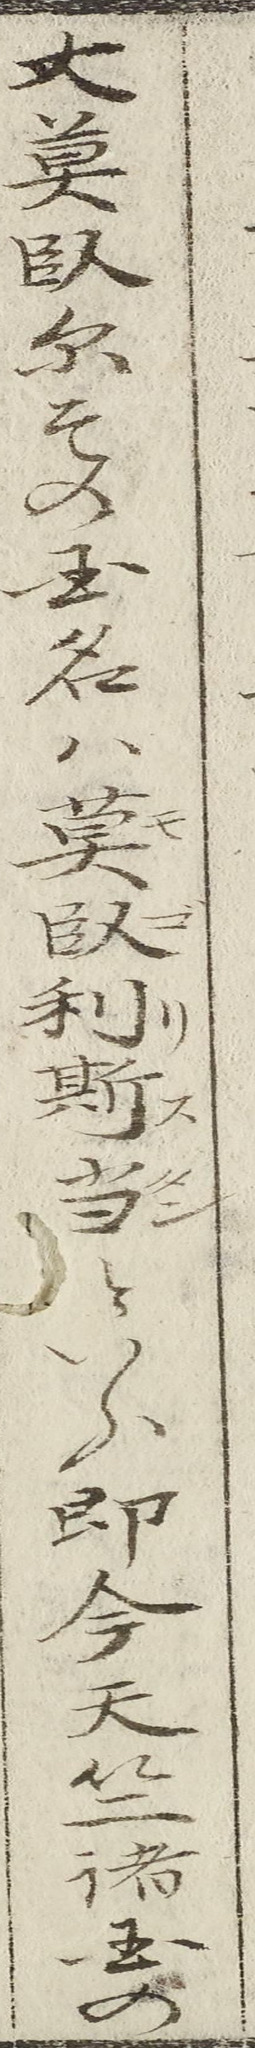大莫臥尓その国名ハ莫臥利斯当といふ即今天竺諸国の
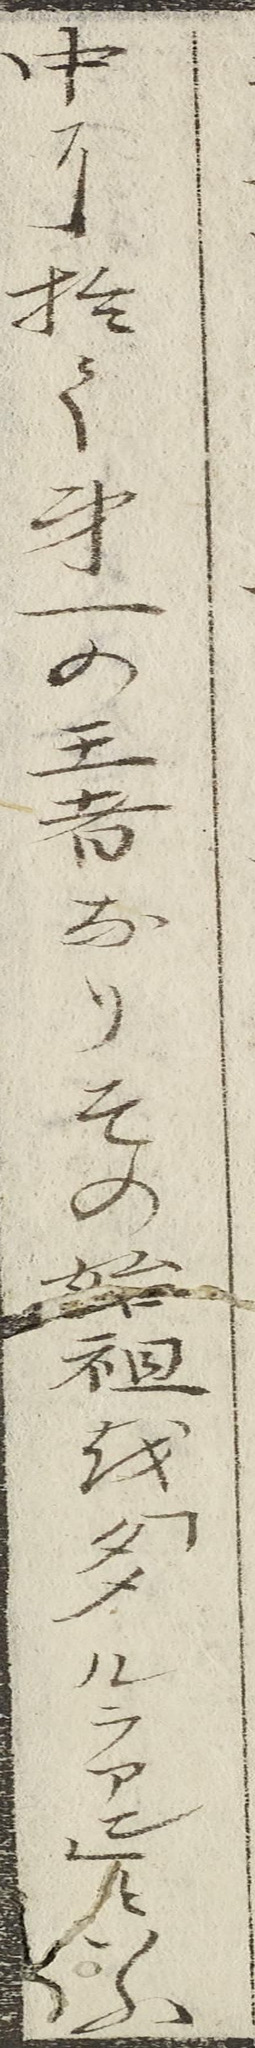中に於て第一の王者なりその始祖を「タメルラアン」といふ
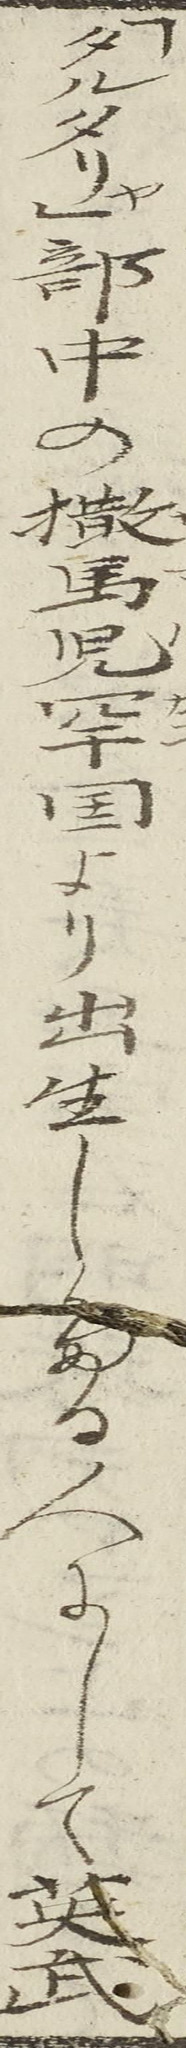「タルタリ」部中の撒馬児罕国より出生したる人にして英武
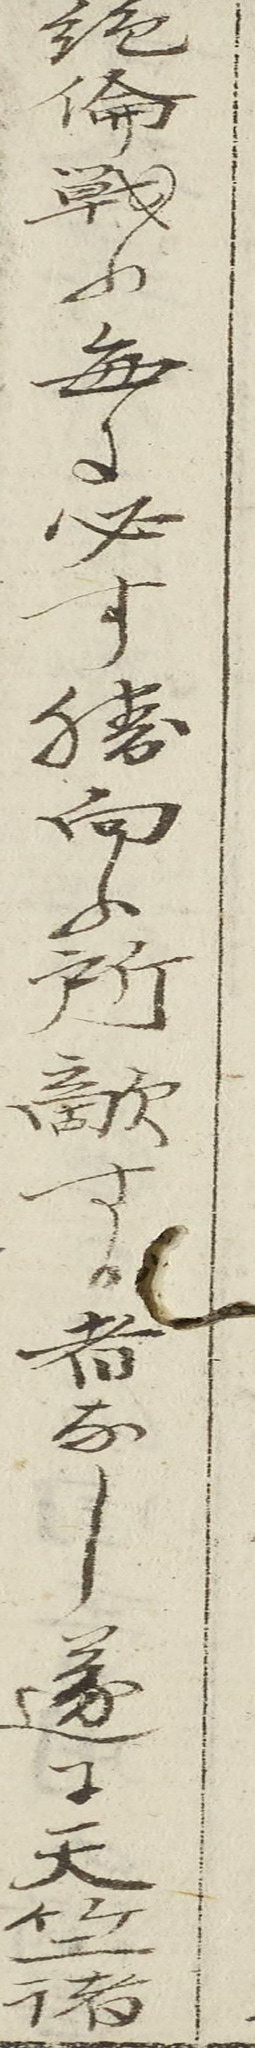絶倫戦の毎に必す勝向ふ所敵する者なし遂に天竺諸
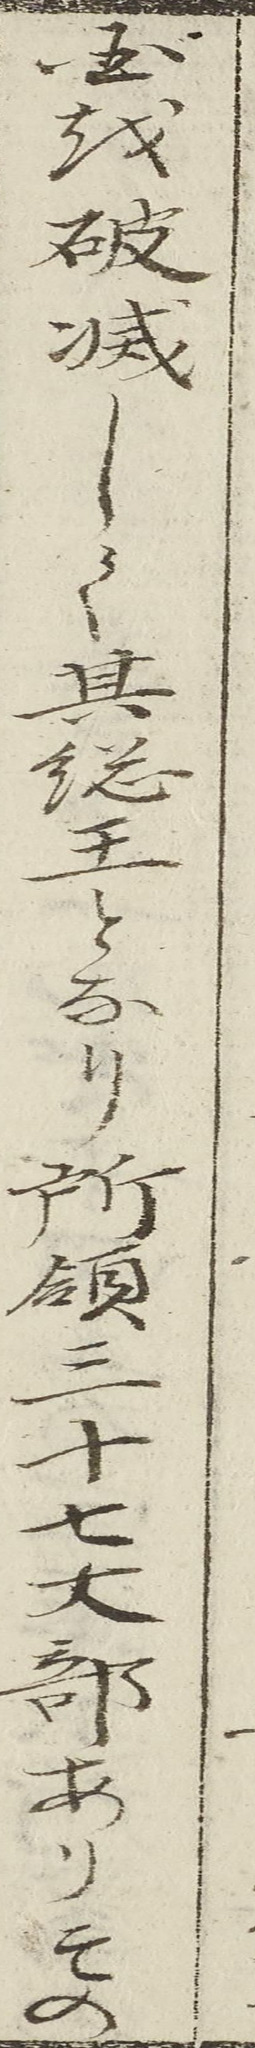国を破滅して其総王となり所領三十七大部ありその
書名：西洋雜記　坤
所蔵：東京大学地震研究所図書室 Earthquake Research Institute Library, The University of Tokyo, JAPAN
